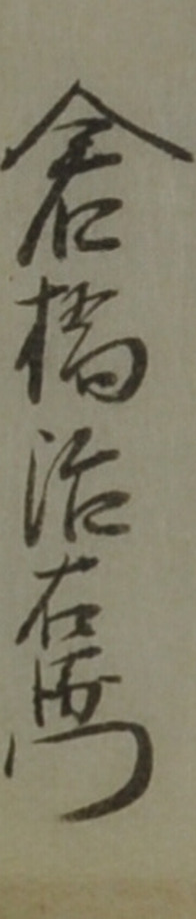倉橋治右衛門
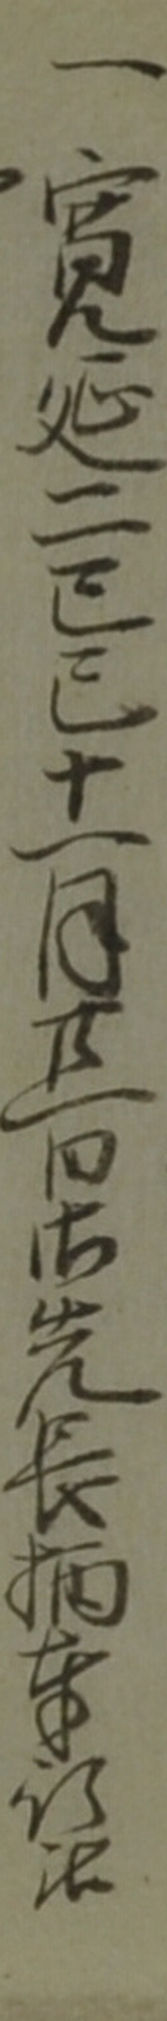一寛延二己巳十一月廿一日御先長柄奉行被
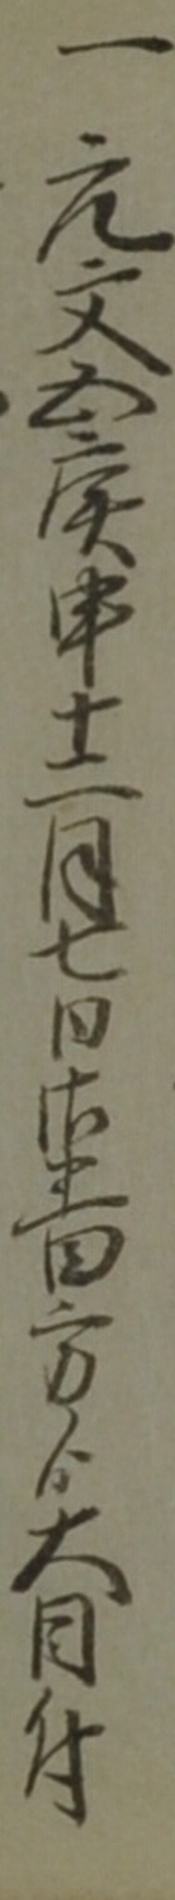一元文五庚申十二月七日御番方ゟ大目付
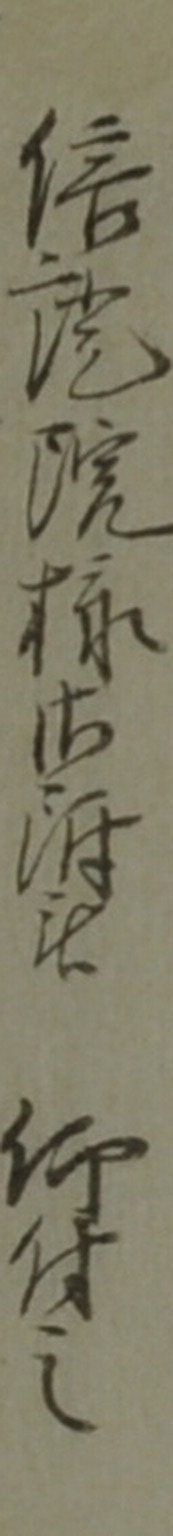信証院様御附被仰付之
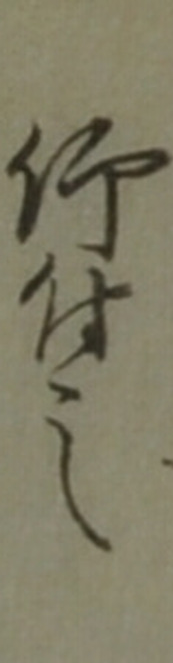仰付之
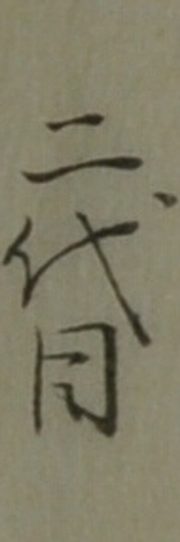二代目
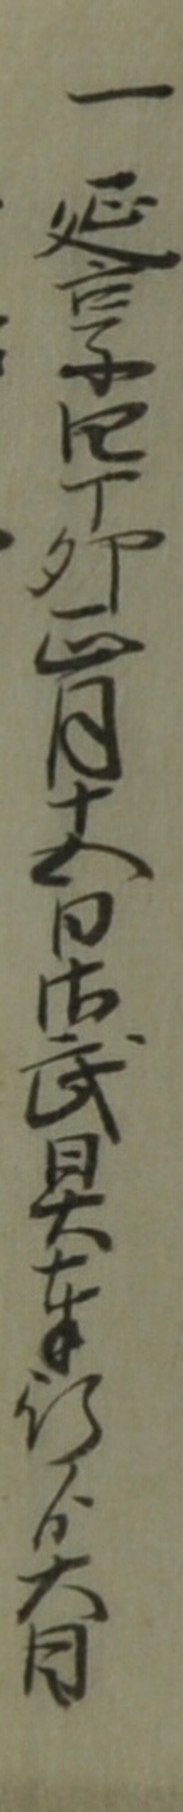一延享四丁卯正月十五日御武具奉行ゟ大目
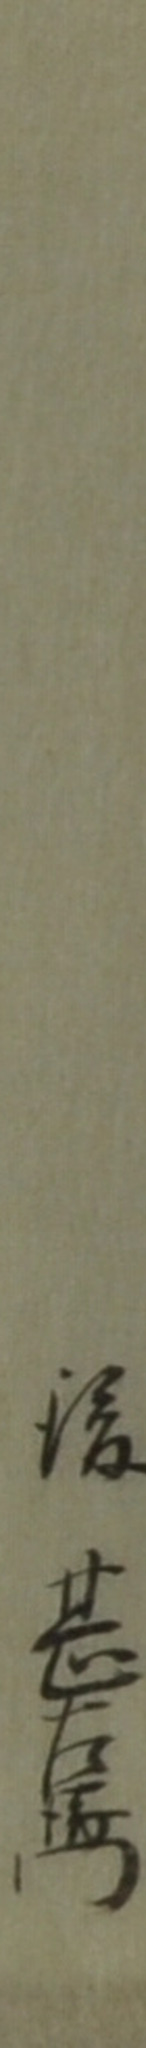後甚右衛門
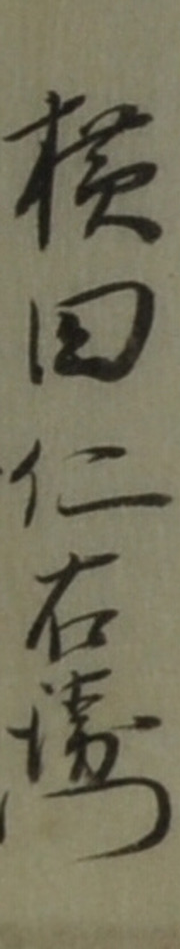横田仁右衛門
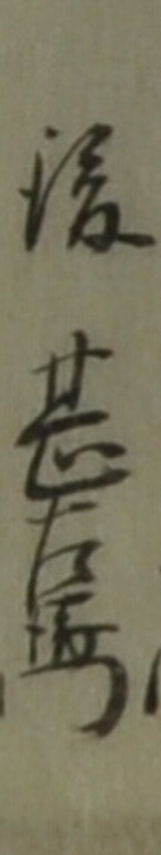後甚右衛門
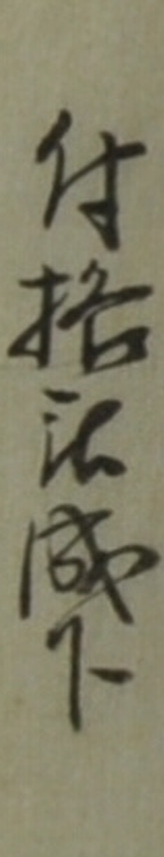付格被成下

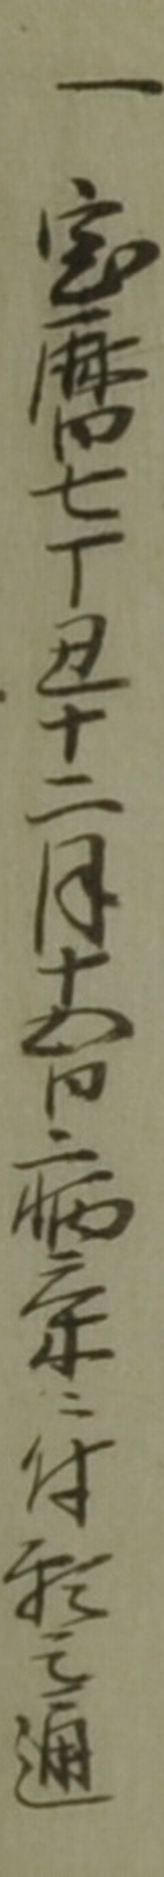一宝暦七丁丑十二月十五日病気ニ付願之通
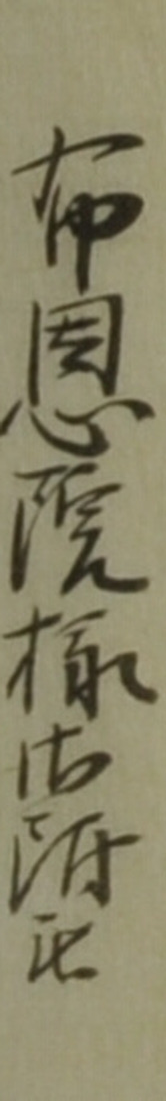布恩院様御附
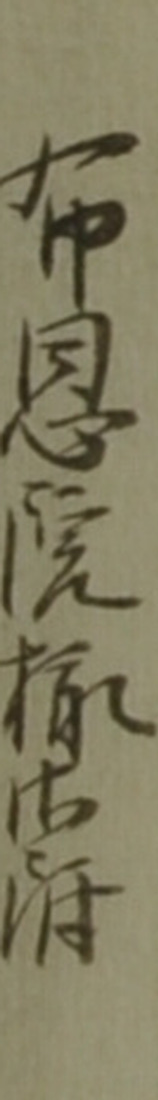布恩院様御附
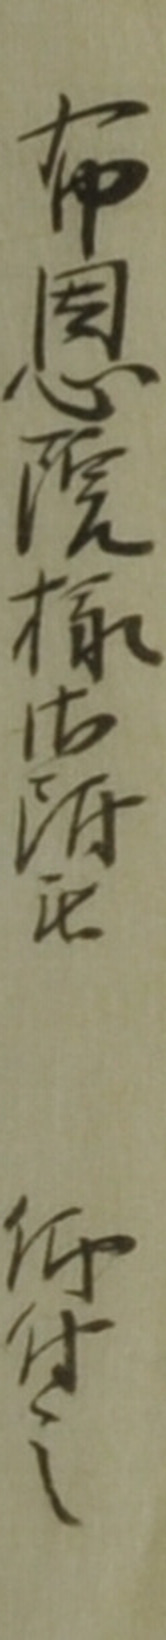布恩院様御附被仰付之
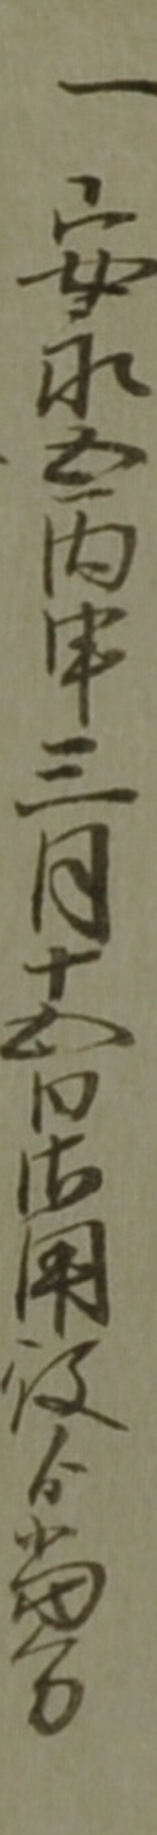一安永五丙申三月十五日御用役ゟ当分
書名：諸御役代々録（六）
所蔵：伊那市立高遠町図書館・合同会社AMANE
